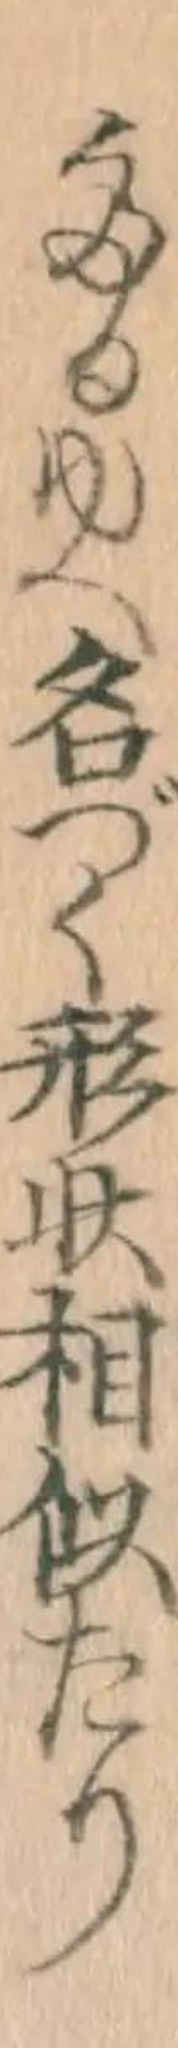たるゆへ名づく形状相似たり
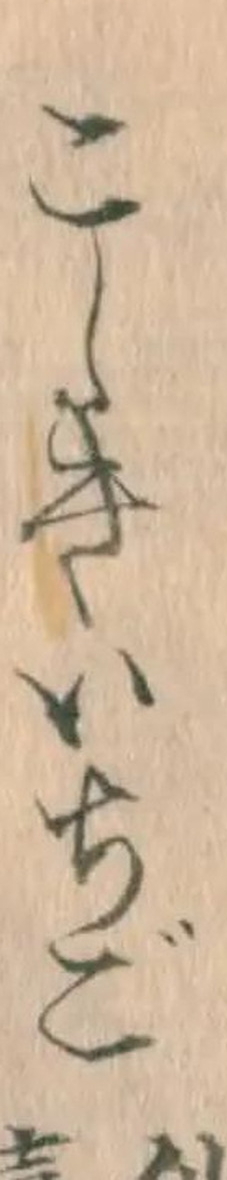こしきいちこ
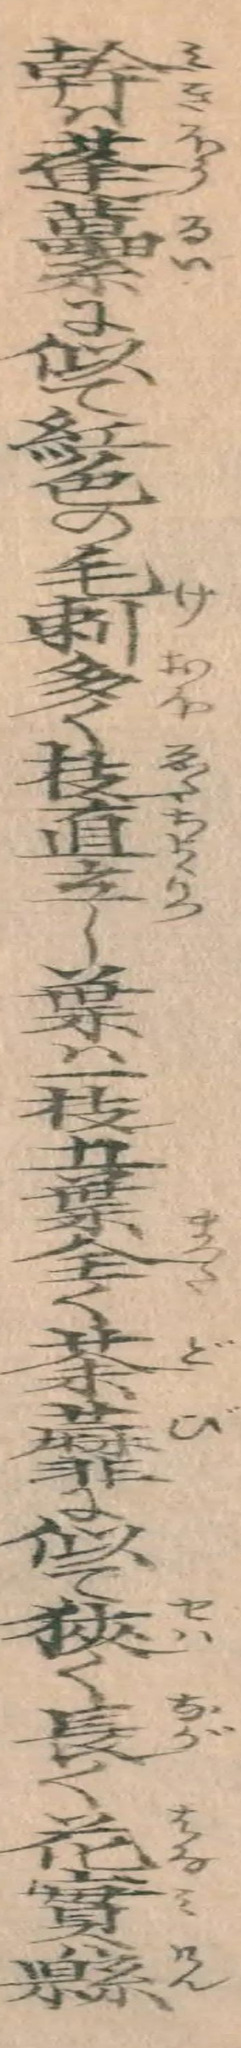幹は蓬虆に似て紅色の毛剌多く枝直立し葉は一枝五葉全く荼蘼に似て狭く長く花実県
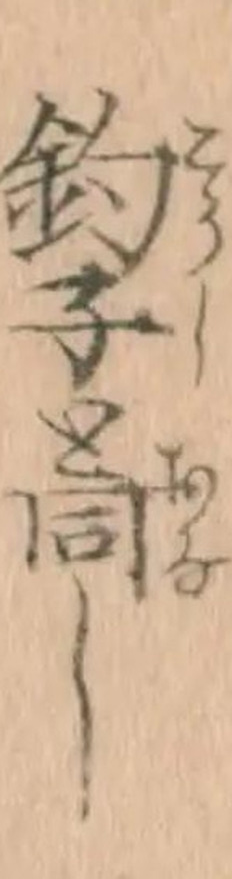釣子と同し
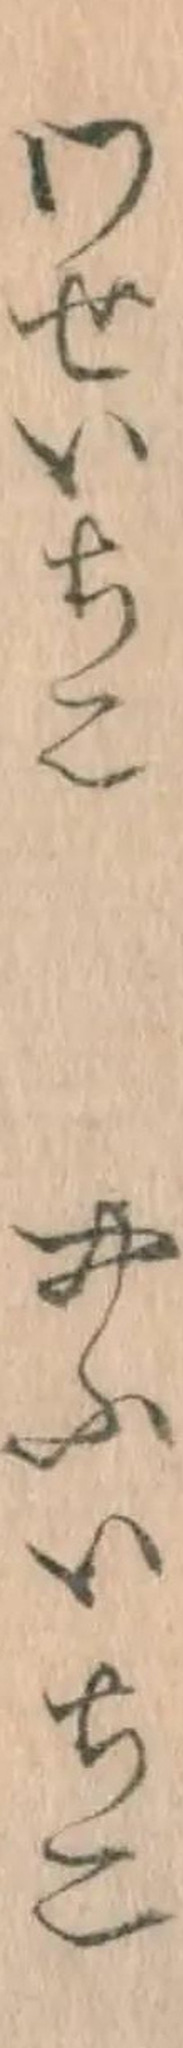わせいちこやふいちこ
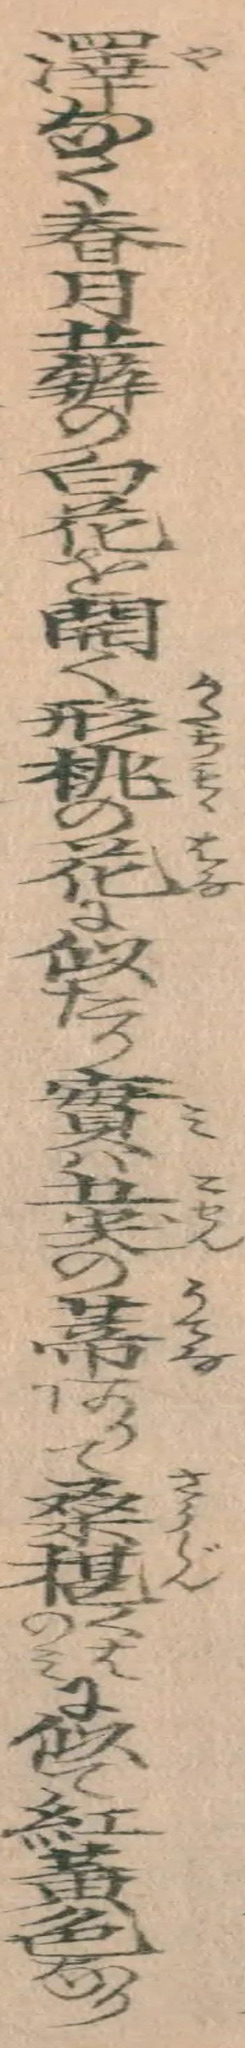沢なく春月五弁の白花を開く形桃の花に似たり実は五尖の蒂ありて桑椹くはのみに似て紅黄色なり
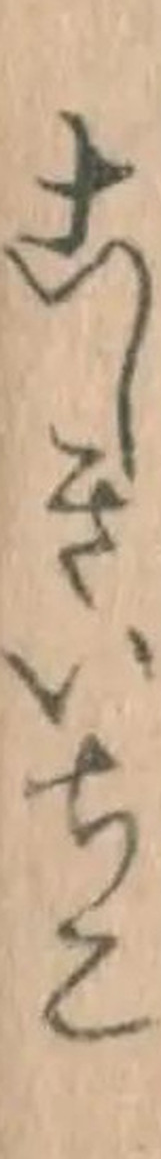こしきいちこ

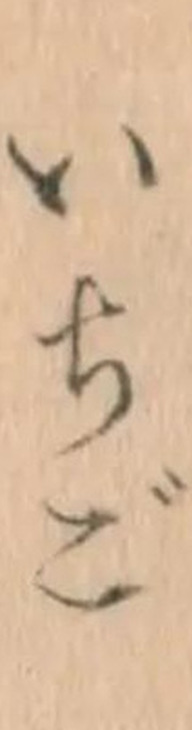いちご
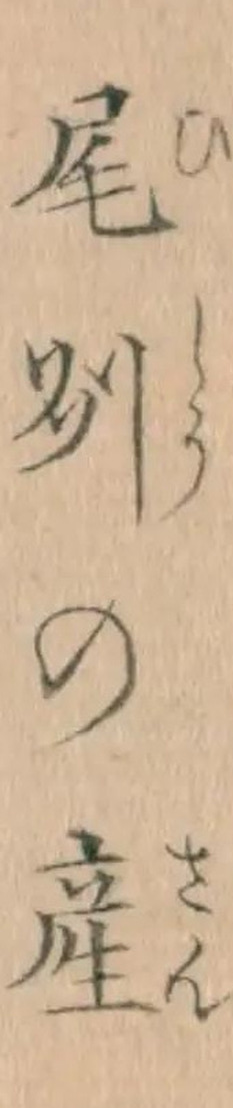尾州の産

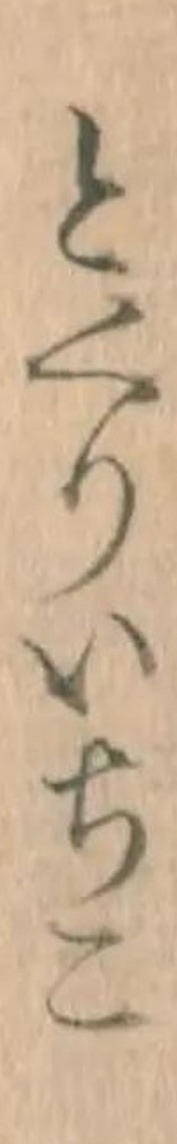とくりいちこ
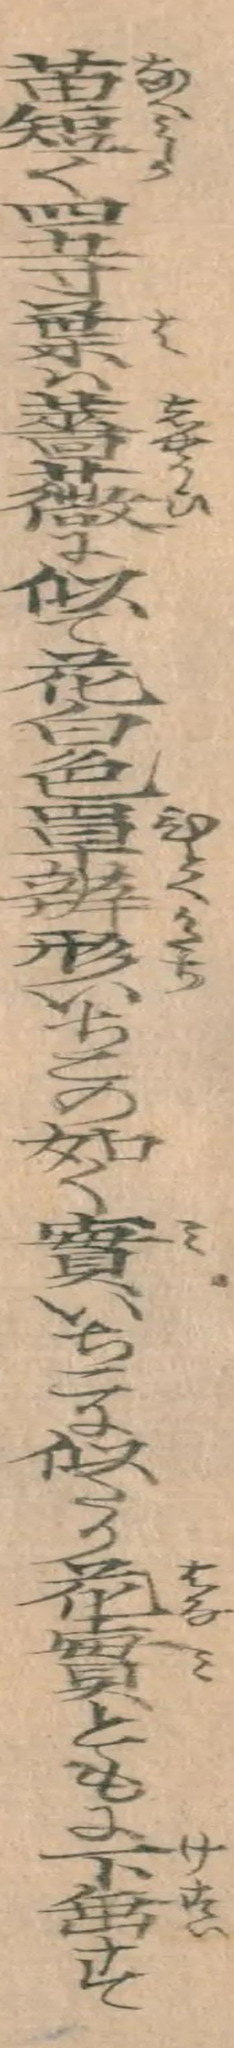苗短く四五寸葉は薔薇に似て花白色単弁形いちこの如く実いちこに似たり花実ともに下垂す
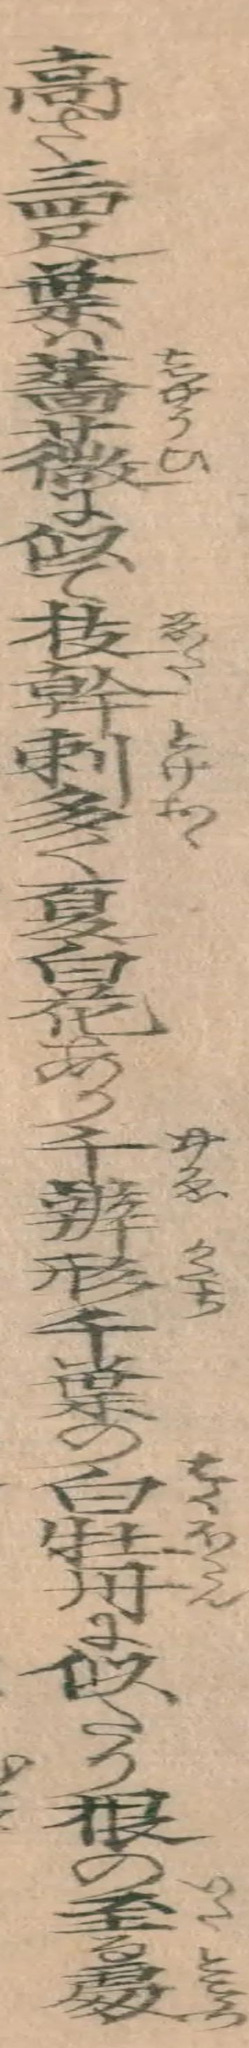高さ三四尺葉は薔薇に似て枝幹剌多く夏白花あり千弁形千葉の白牡丹に似たり根の至る処
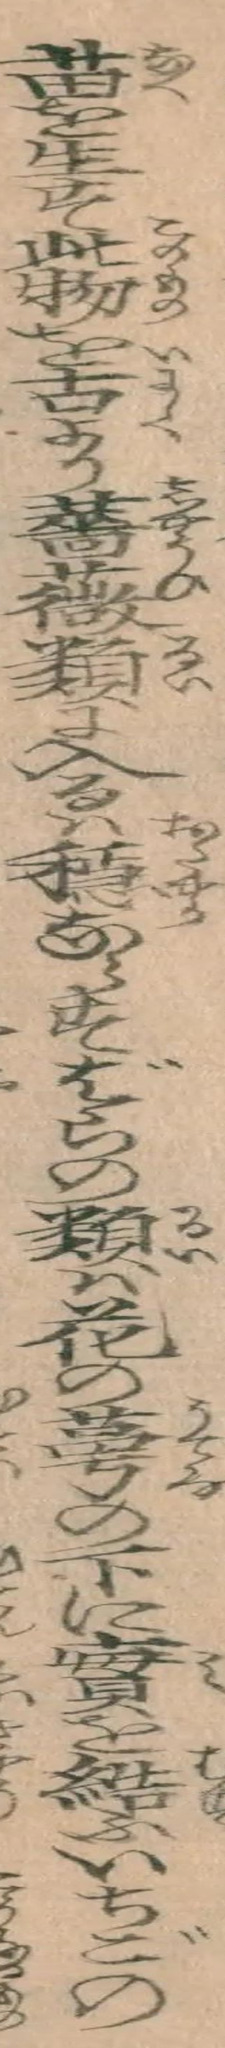苗を生す此物を古より薔薇類に入るは穏ならすばらの類は花の萼の下に実を結ふいちごの
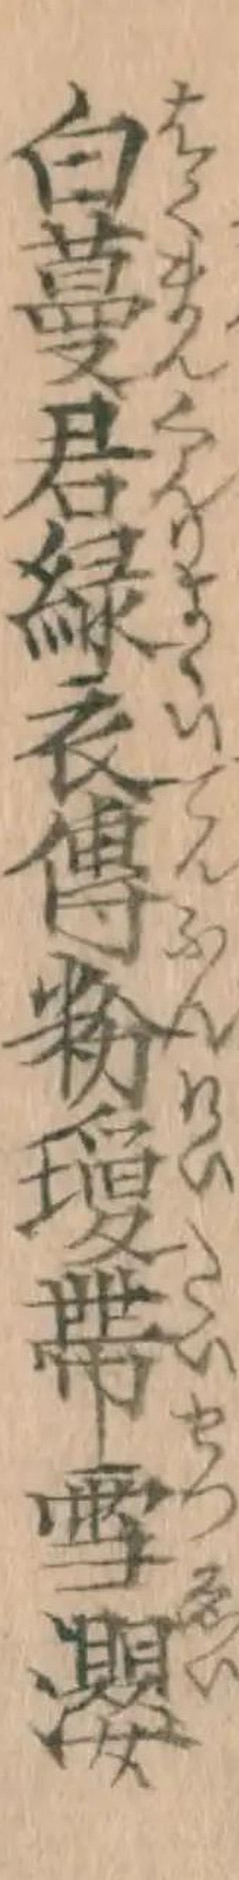白蔓君緑衣伝粉瓊帯雪瀴
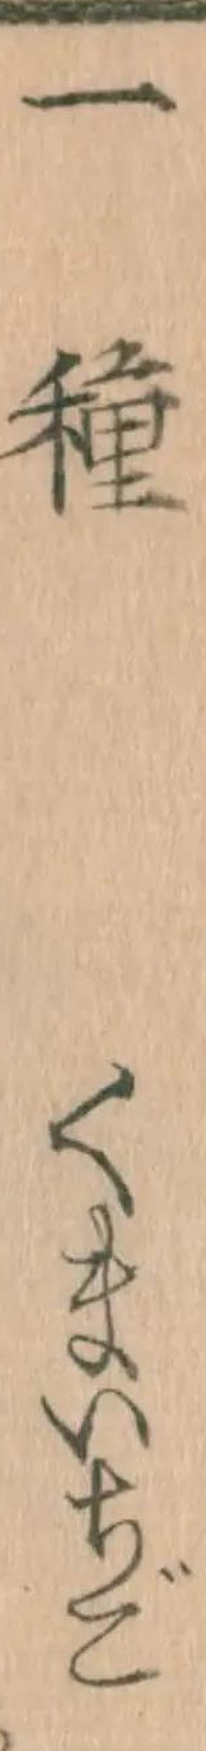一種くまいちご
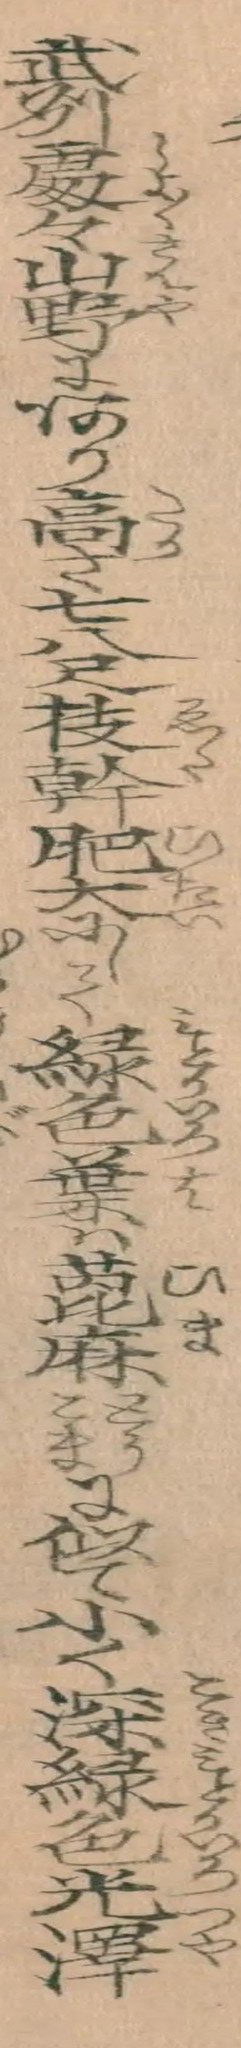武州処々山野にあり高さ七八尺枝幹肥大にして緑色葉は蓖麻とうこまに似て小く深緑色光沢
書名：本草図譜. 巻25-27
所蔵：国立国会図書館 National Diet Library, JAPAN
